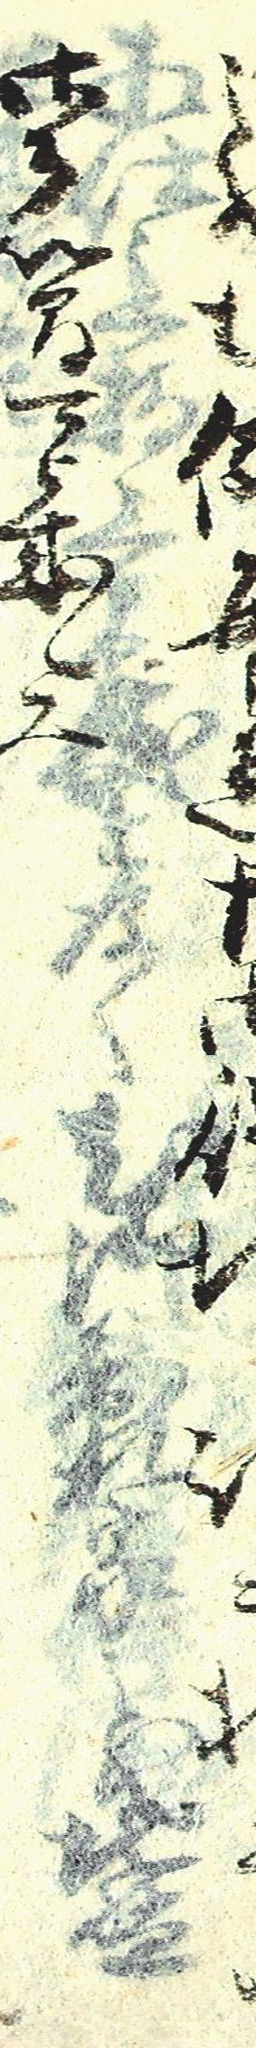御了簡可被成候以上
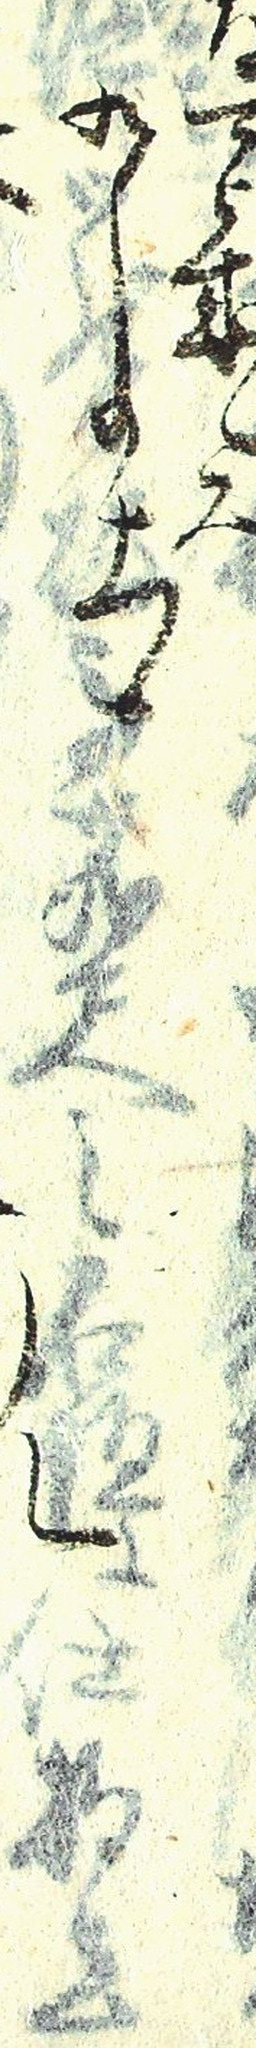九月十一日
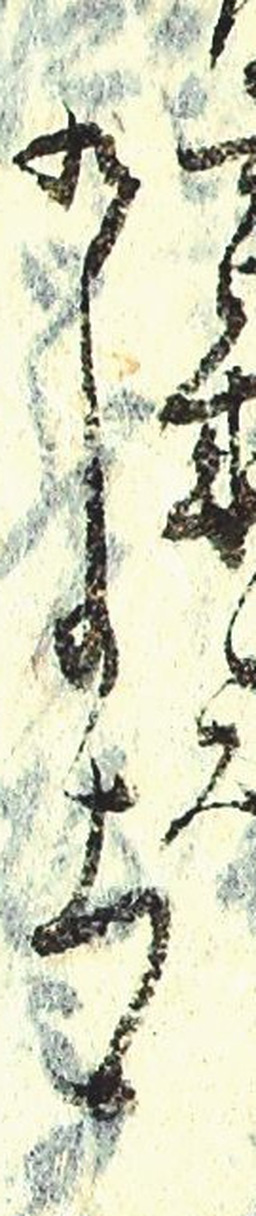九月十一日
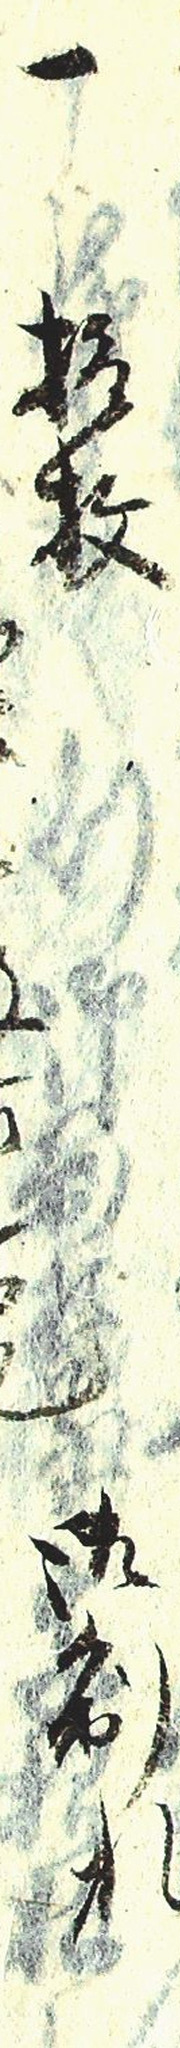一拾枚御制札
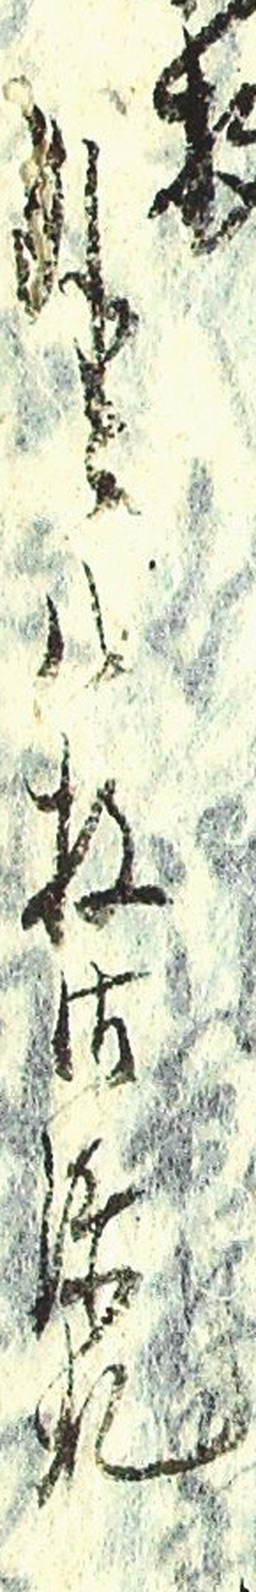外に八枚御添札

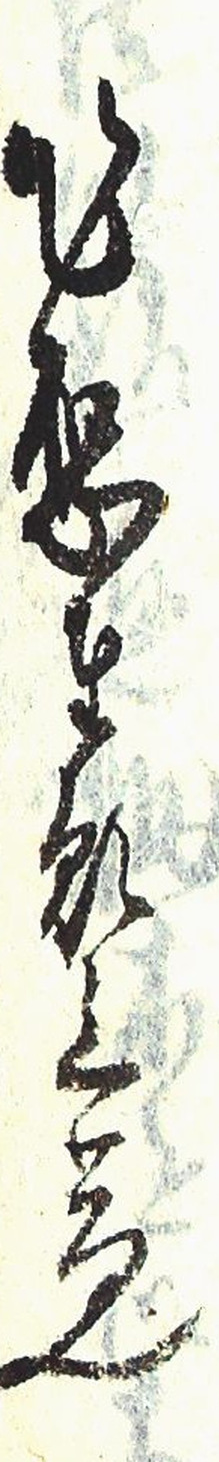乍恐奉願上覚
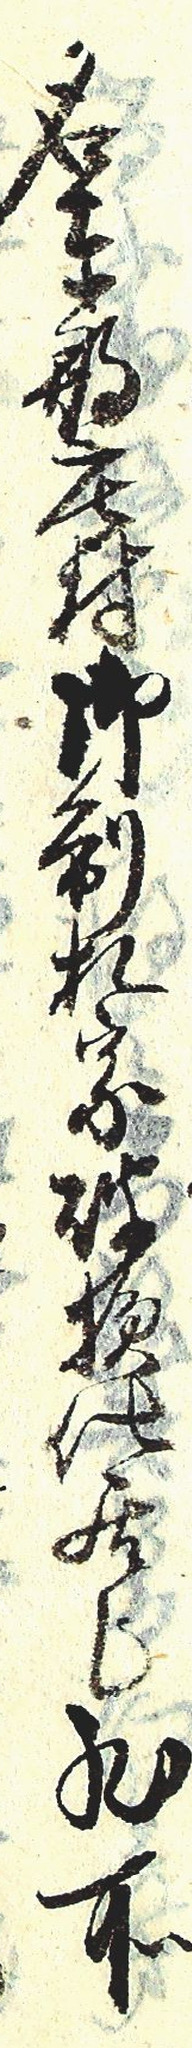名東郡庄村御制札家破損仕居申候然所
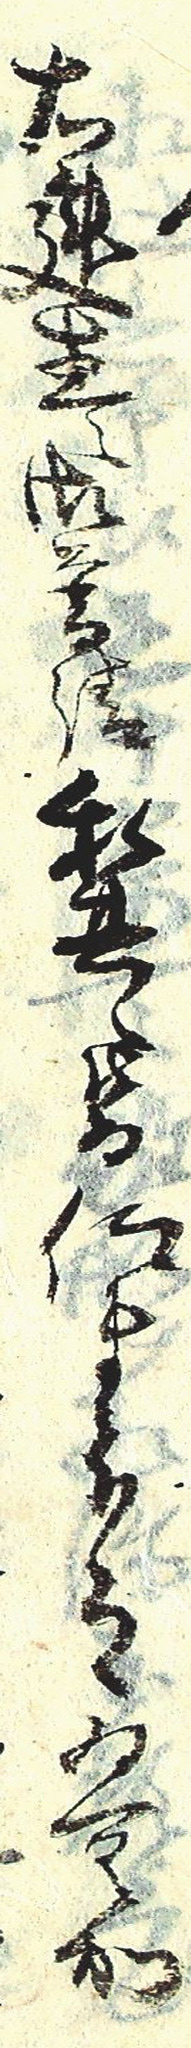右建直し御普請私共へ被為仰付被下候はゝ為冥加
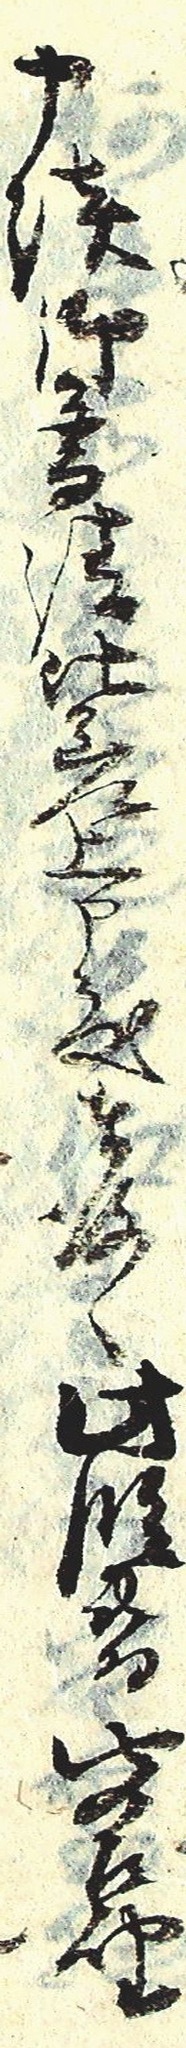申談御普請仕差上申度奉存候此段被為聞召届
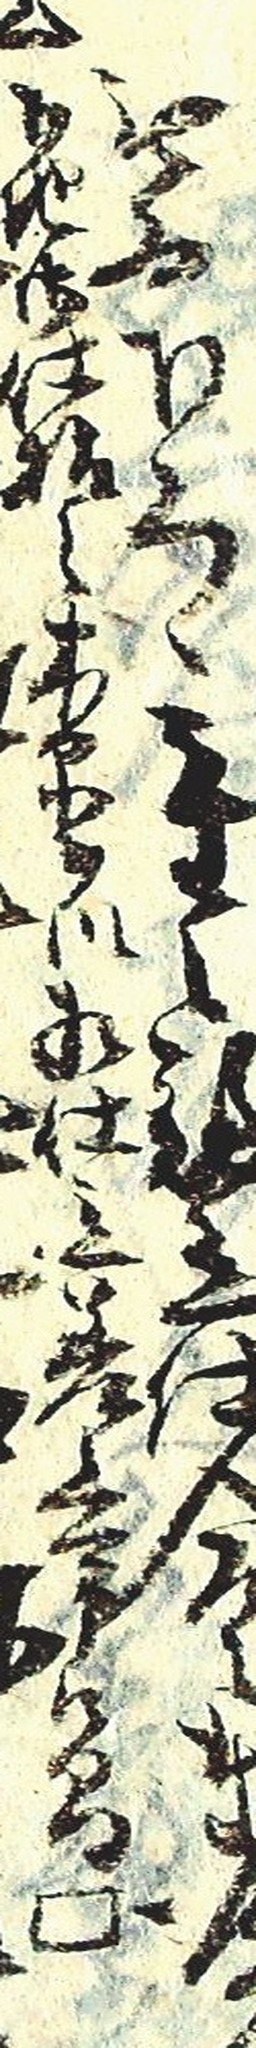下地御仕様之木品を以相仕立差上可申候間
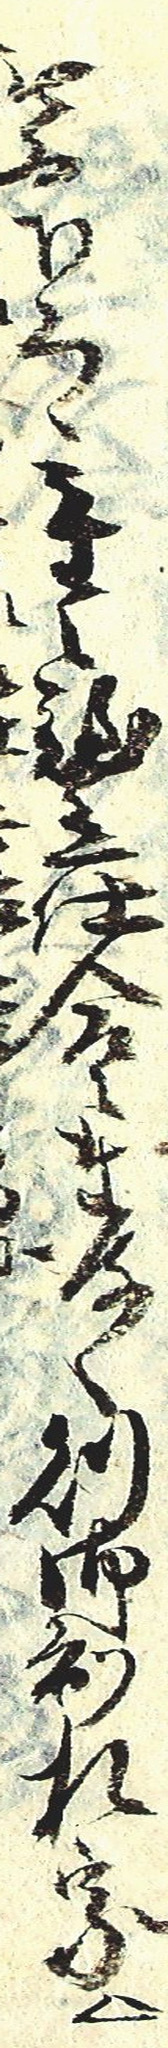被為下候はゝ重々難有仕合に奉存候則御制札家
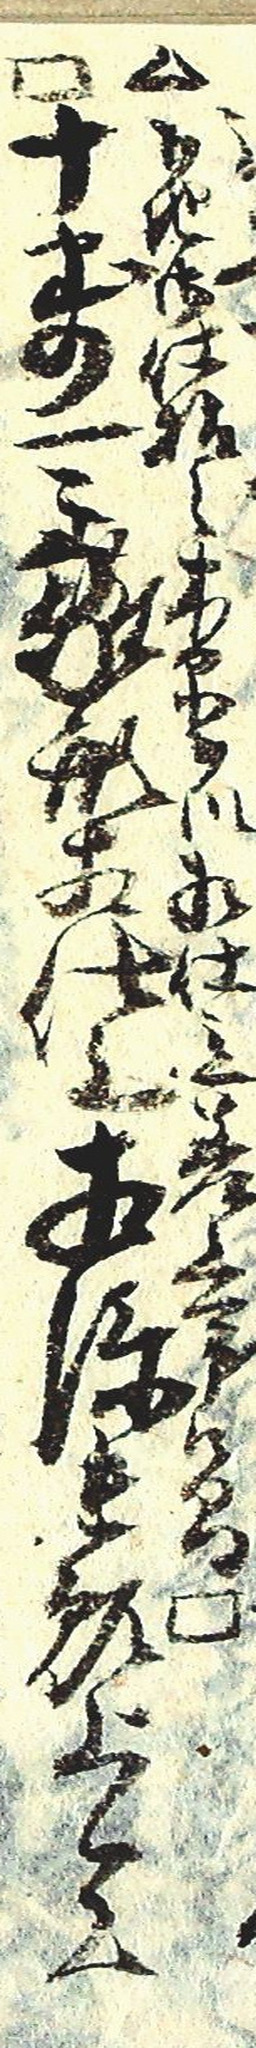十歩一に雛形相仕立相添奉願上候以上
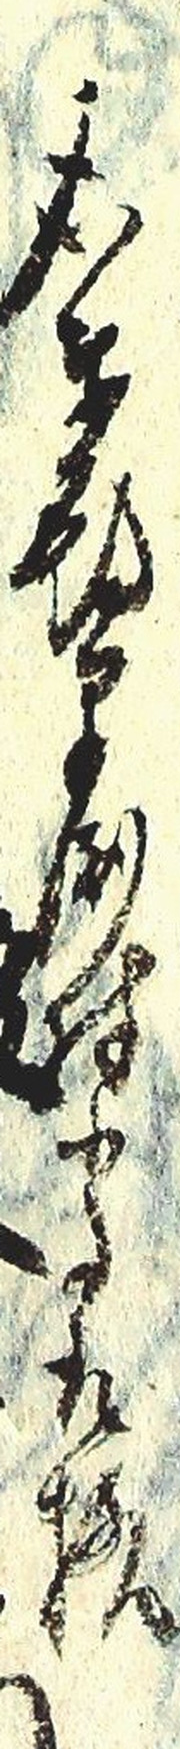名東郡早淵村小高取格
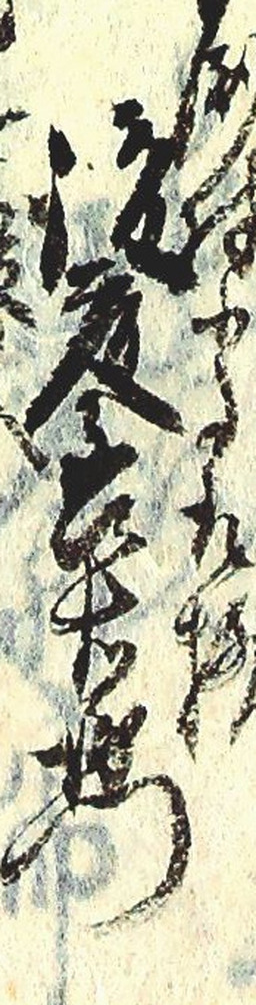後藤善右衛門
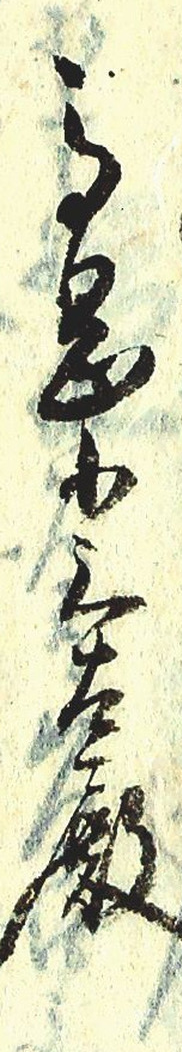高岡小三太殿
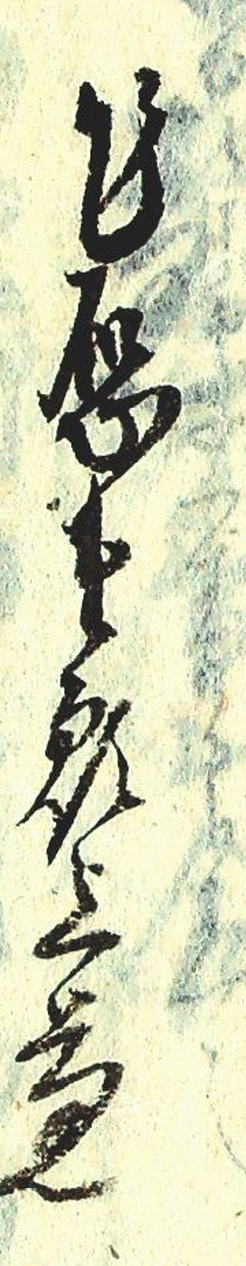乍恐奉願上覚
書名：諸御願書控(弐番）
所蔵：鳴門教育大学 Naruto University of Education
